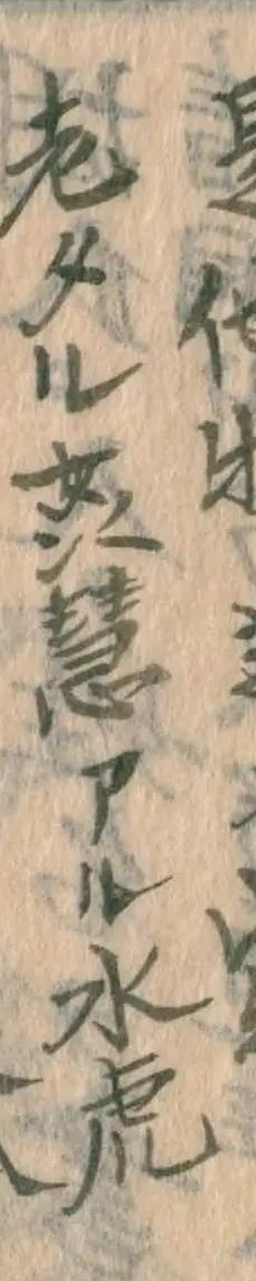老タル姦慧アル水虎
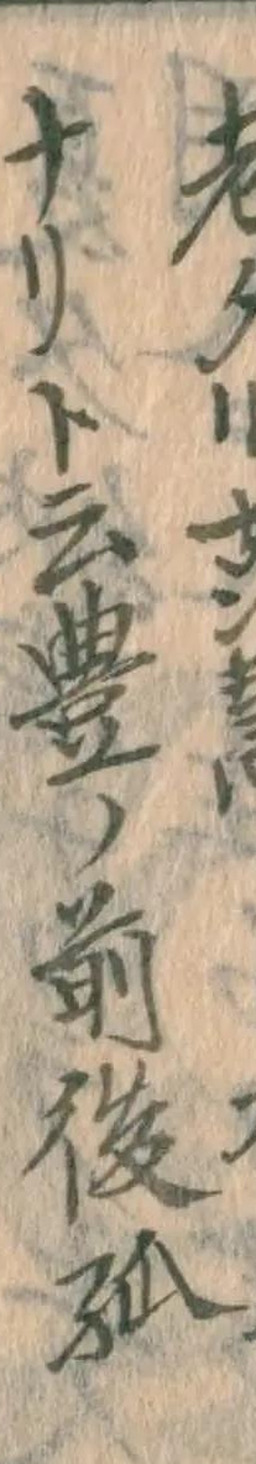ナリト云豊ノ前後孤
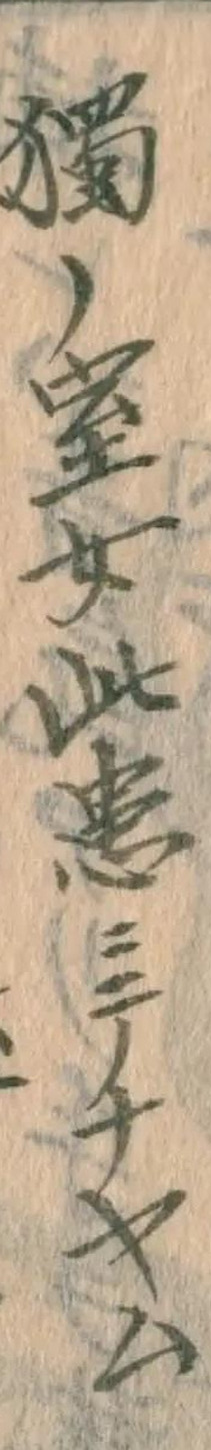独ノ室女此患ニテナヤム
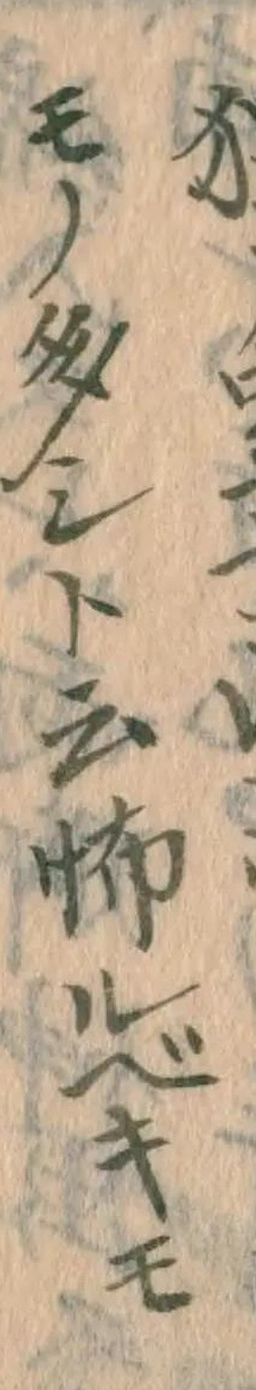モノ多シト云怖ルベキモ

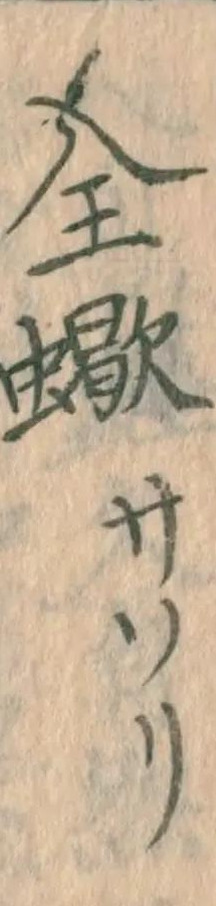全蠍サソリ
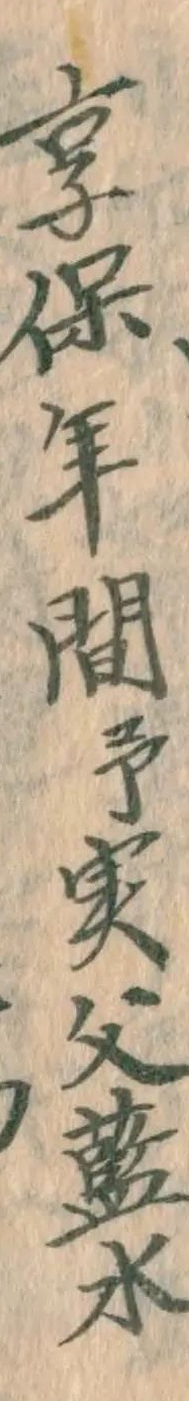享保年間予実父藍水
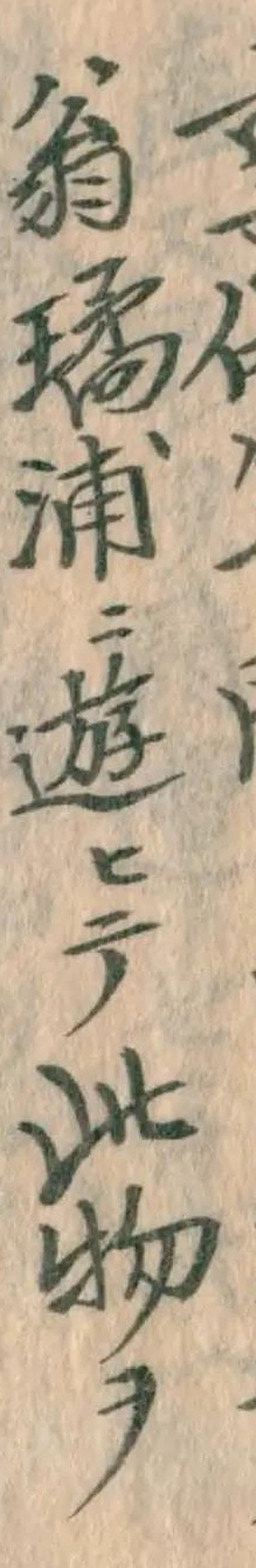翁璚浦ニ遊ヒテ此物ヲ
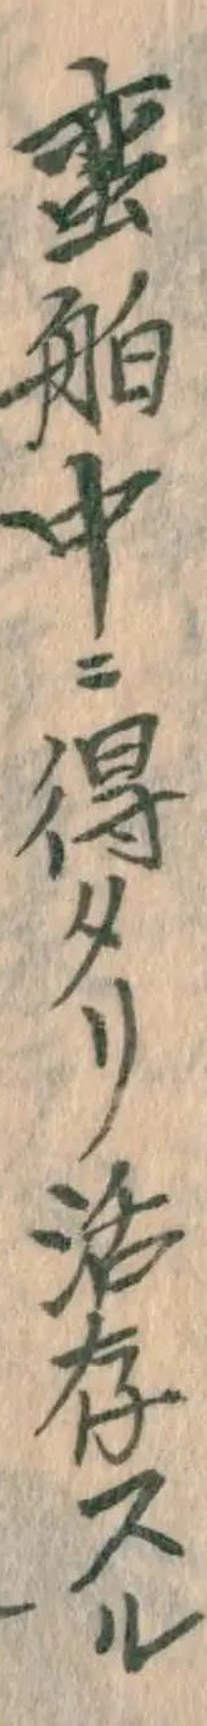蛮舶中ニ得タリ活存スル
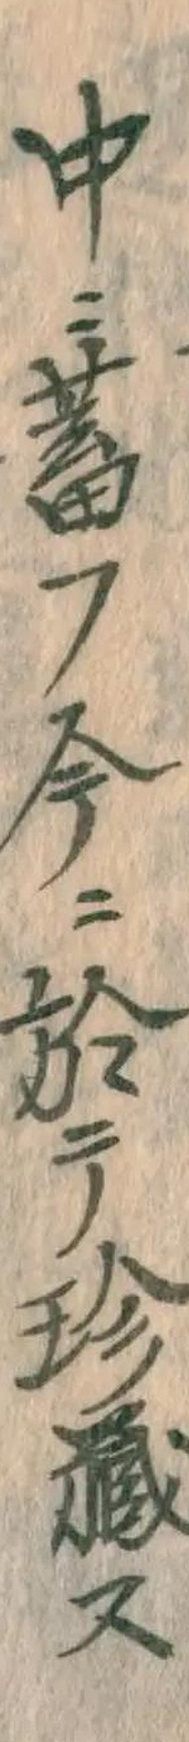中ニ蓄フ今ニ於テ珍蔵ス
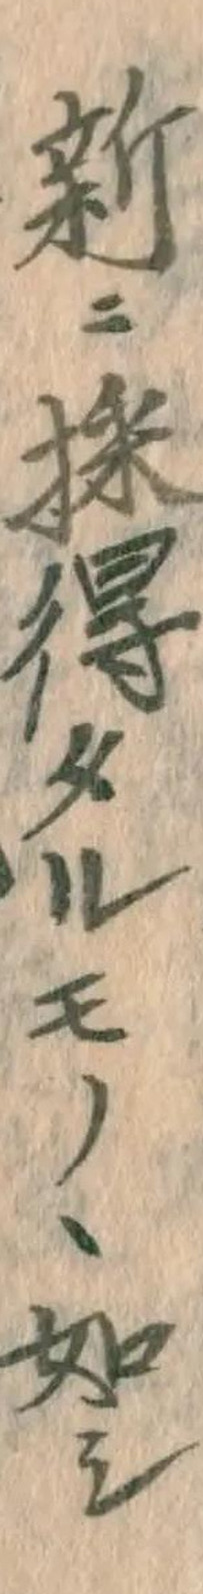新ニ採得タルモノヽ如シ
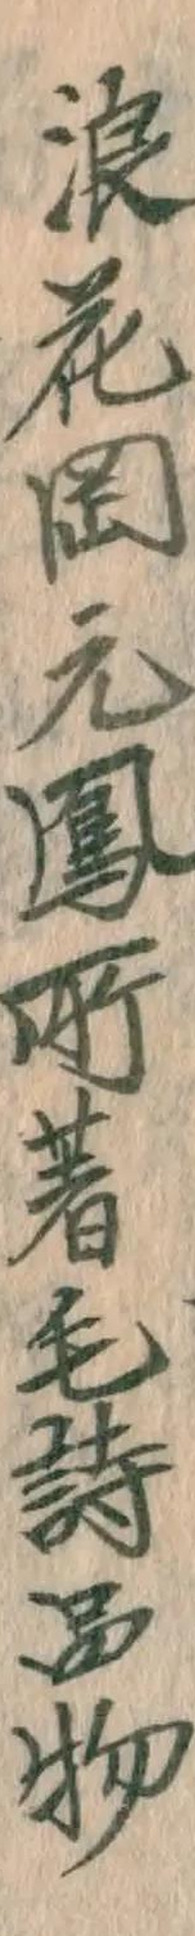浪花岡元鳳所著毛詩品物
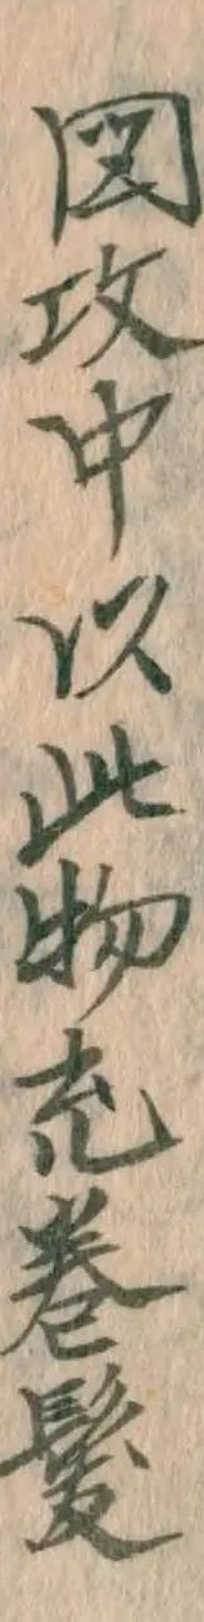図攻中以此物充巻髪
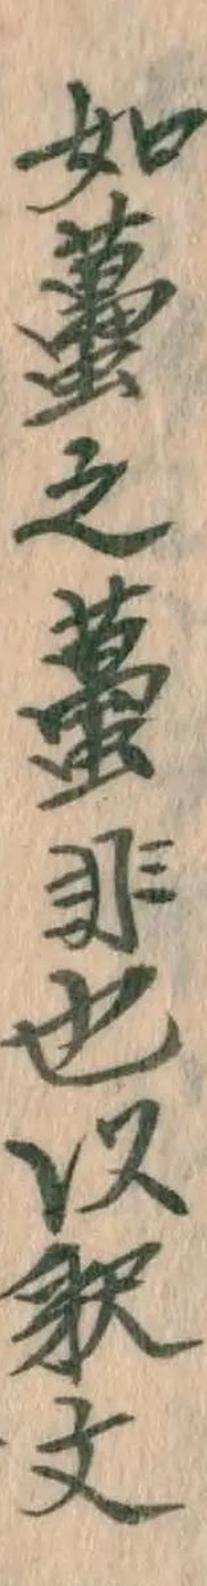如蠆之蠆非也以釈文
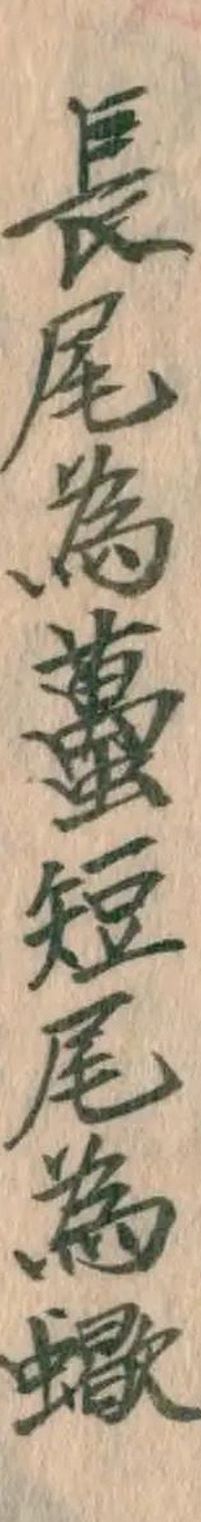長尾為蠆短尾為蠍
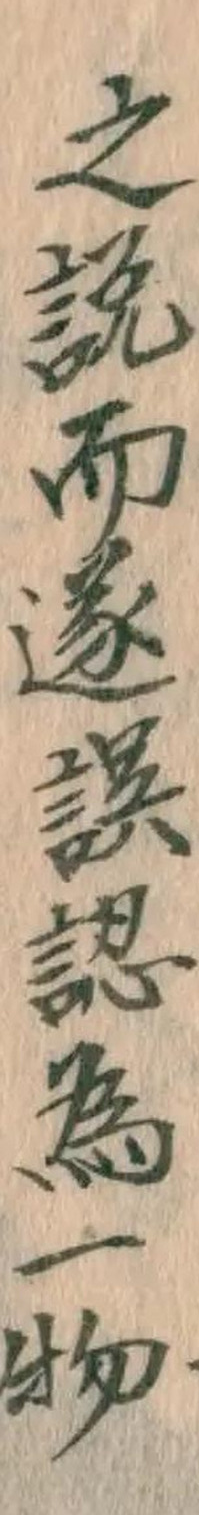之説而遂誤認為一物
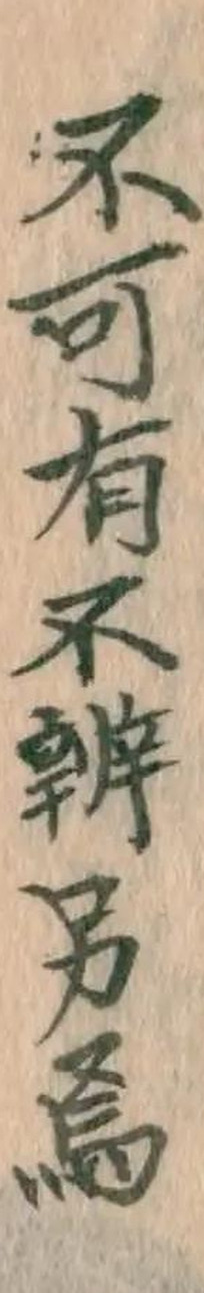不可有不辨另焉
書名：千蟲譜 3巻. [3]
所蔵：国立国会図書館 National Diet Library, JAPAN
